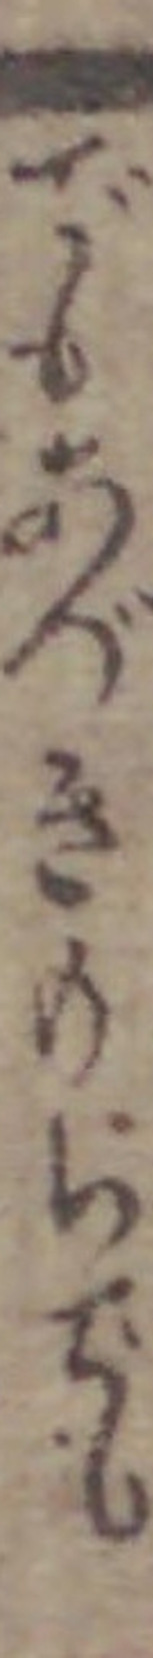でもあづきもちでも
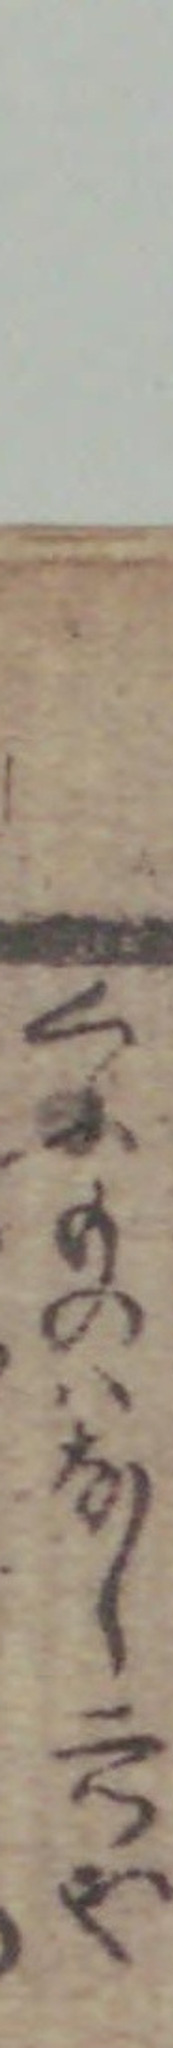くふものはなし二つや
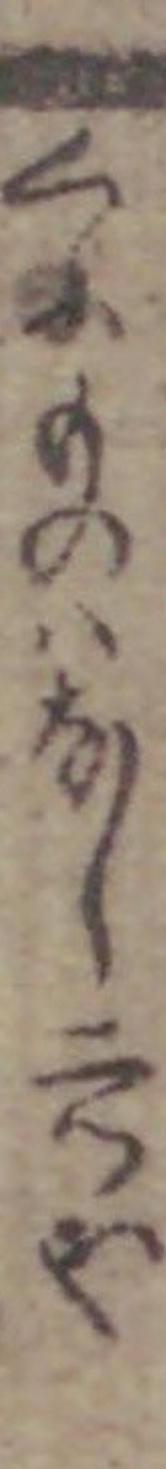くふものはなし二つや
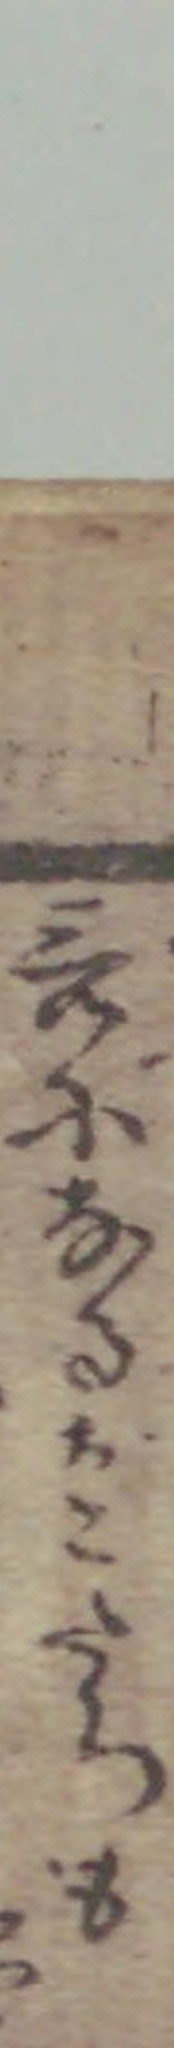三つになるおこたちも
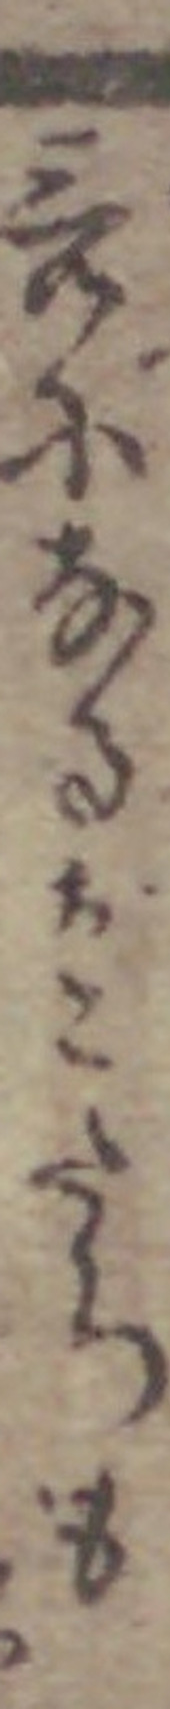三つになるおこたちも
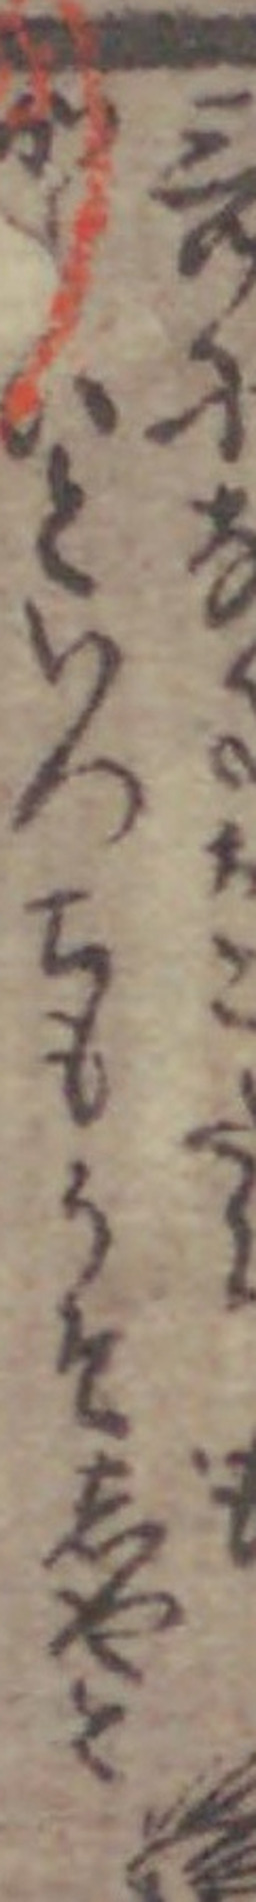からいといつてもうそしやと
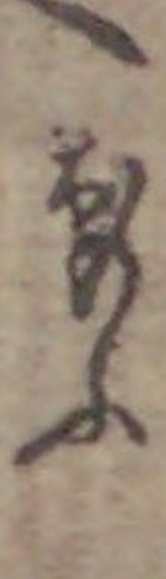おもふ
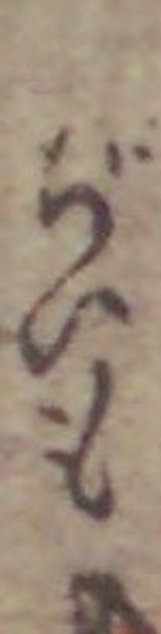ぢいも
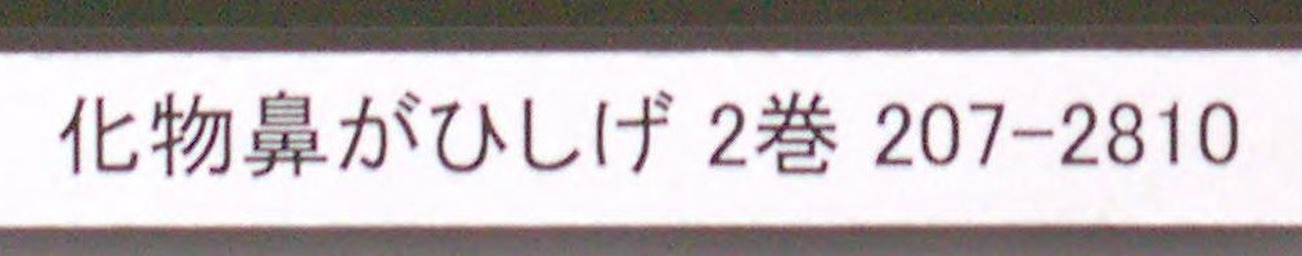化物鼻がひしげ
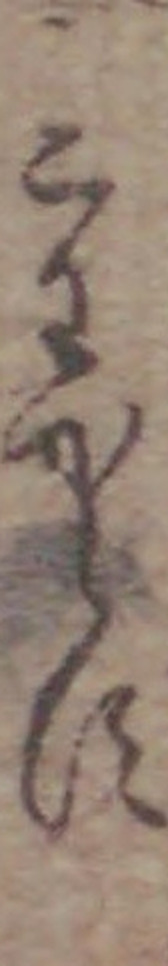こわからず
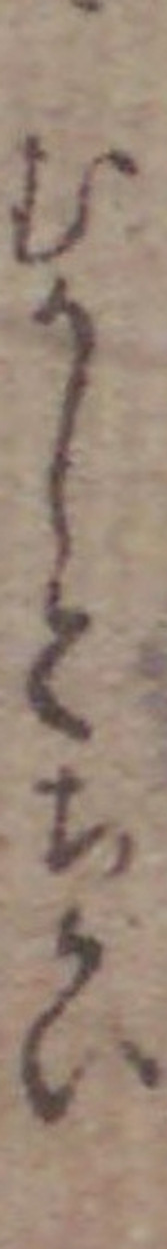むかしとちかい
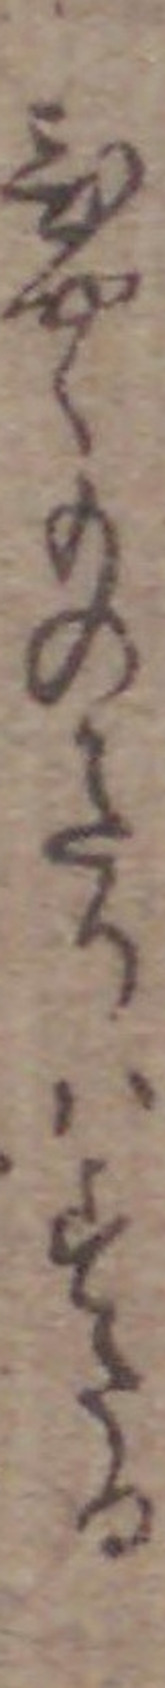ひやくものかたりはすたる
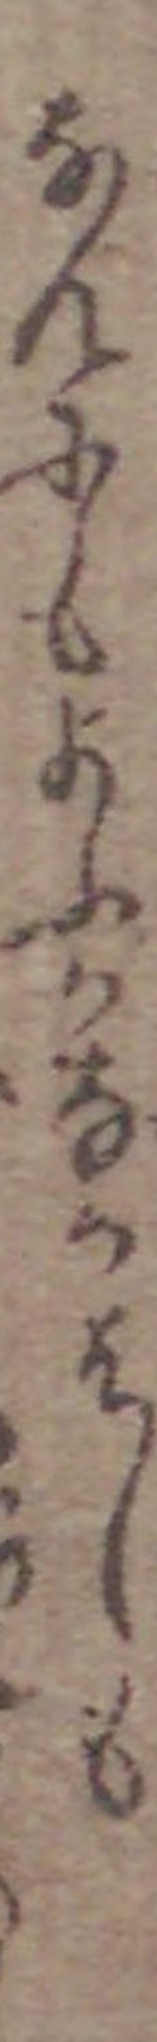なんにもよふかなかはしも
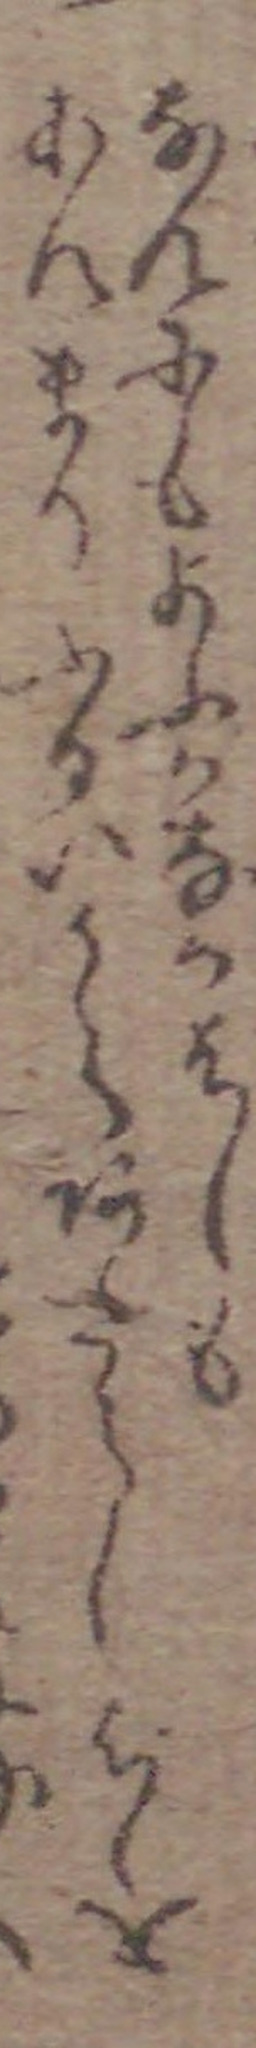あんまりふるいからあたらしくはしを

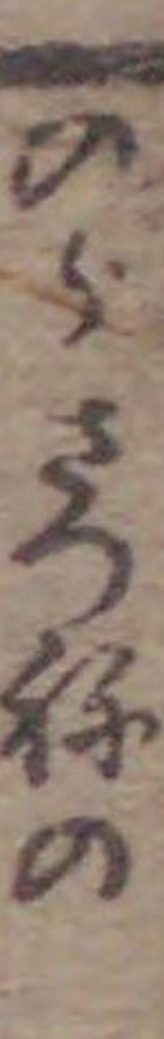のらきつねの
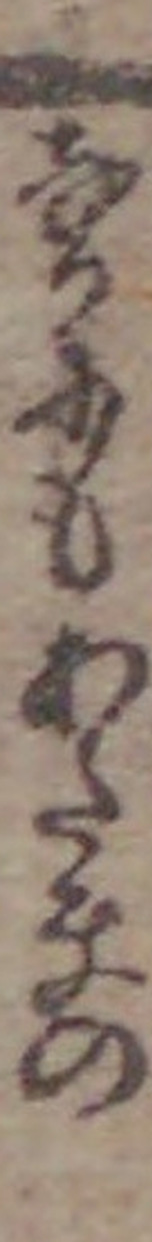なかにもあたまの
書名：化物鼻がひしげ 2巻
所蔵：国立国会図書館 National Diet Library, JAPAN
